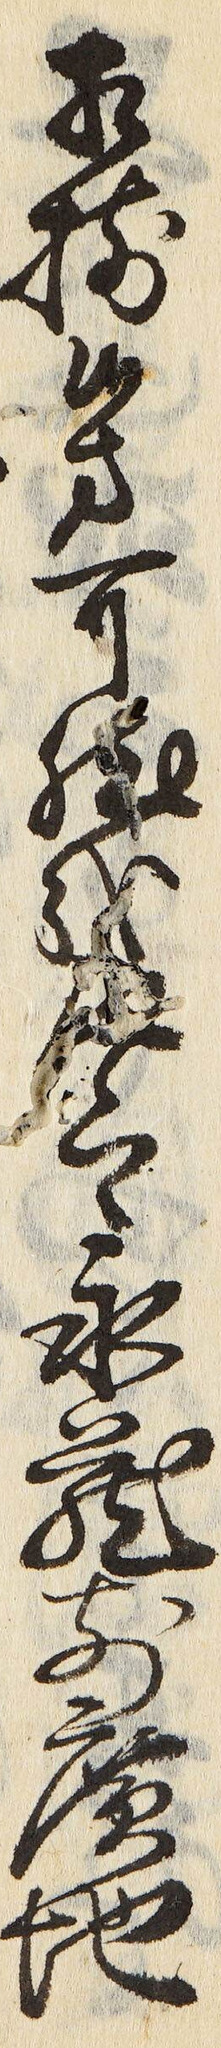相揃候方可然哉候ハヽ永蔵前広地
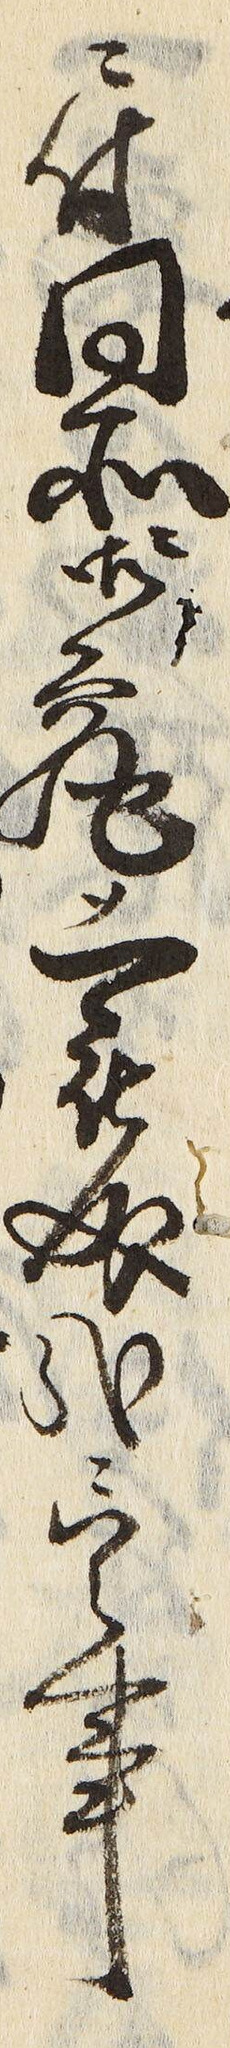ニ付同所ニ御究メ可被成哉ニ候事
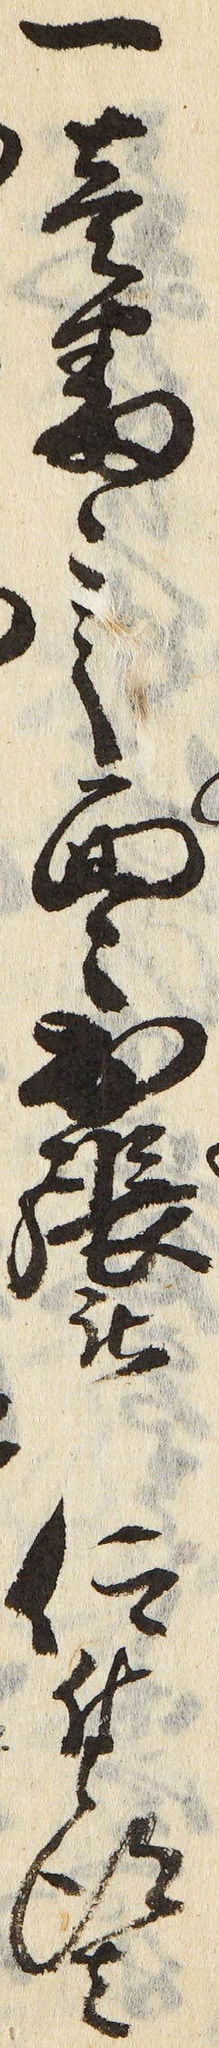一壱番番之面々出張被仰付候得者
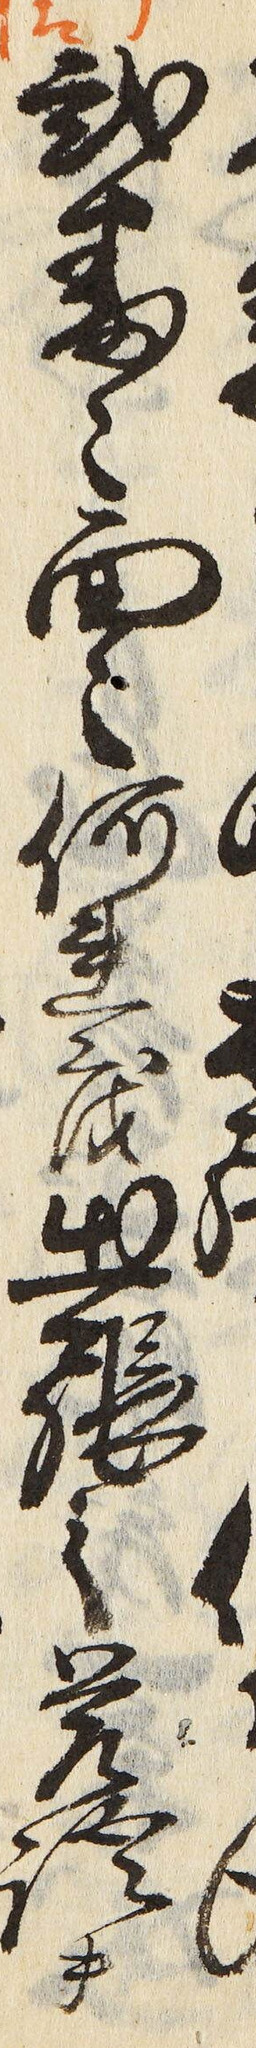弐番之面々何れも出張之覚語ヲ
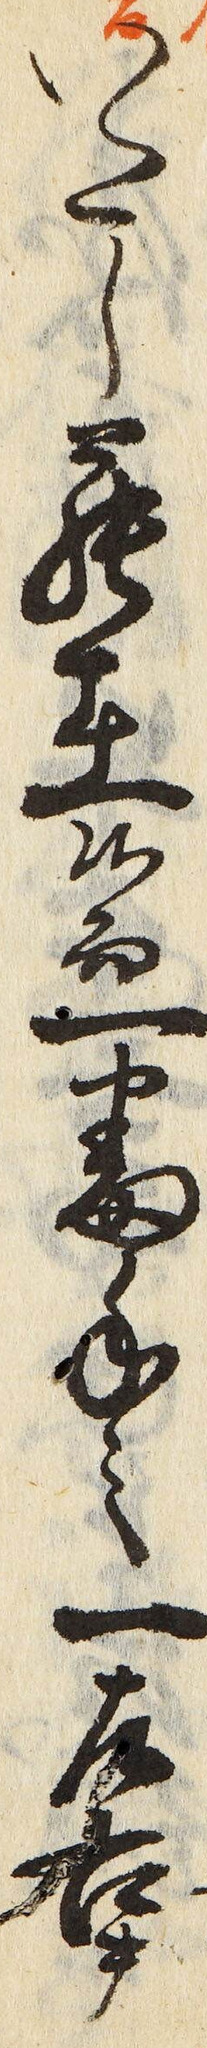いたし罷在候而一番手之一左右ヲ
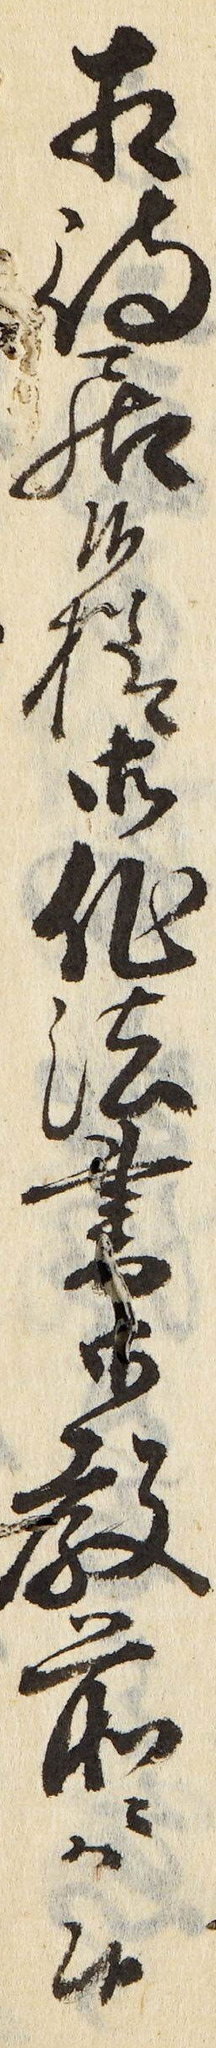相待居候様御作法書御教前々ニ而候
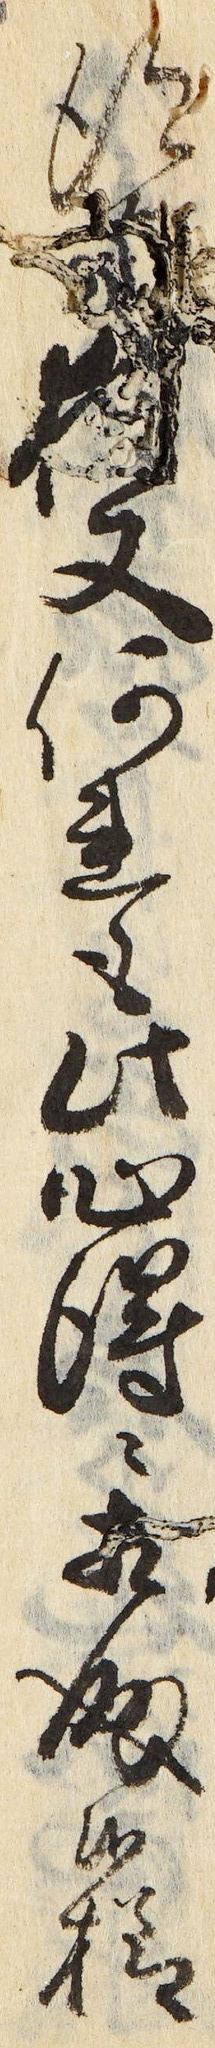得共猶又何れも此心得ニ相成候様

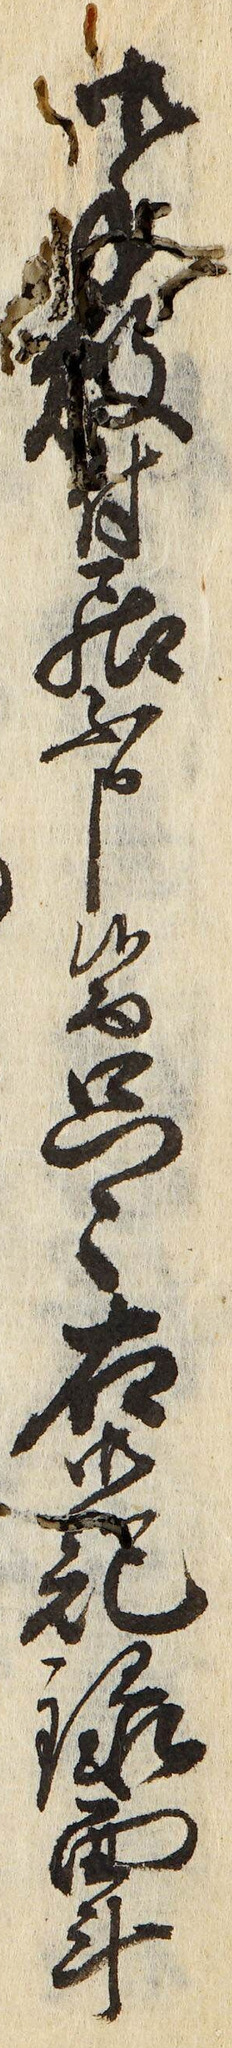御数付居不申候而只々右御記録面計
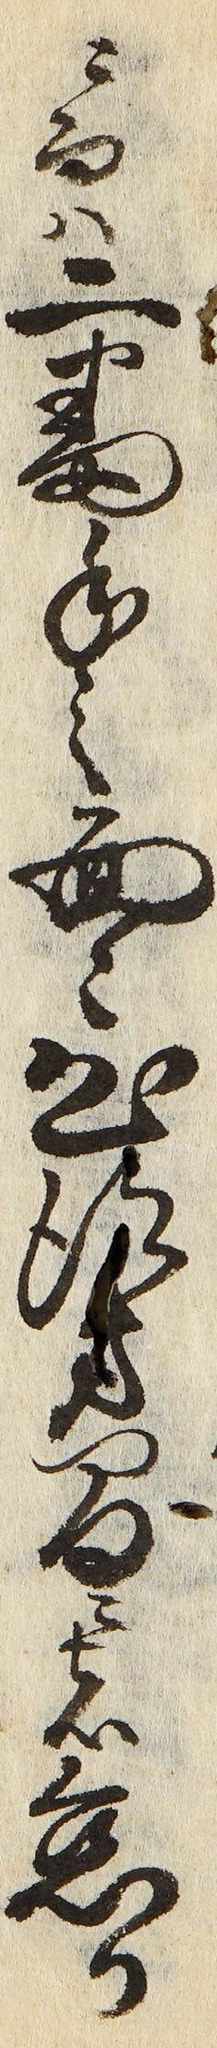ニ而ハ二番手之面々心得方間ニ者怠り
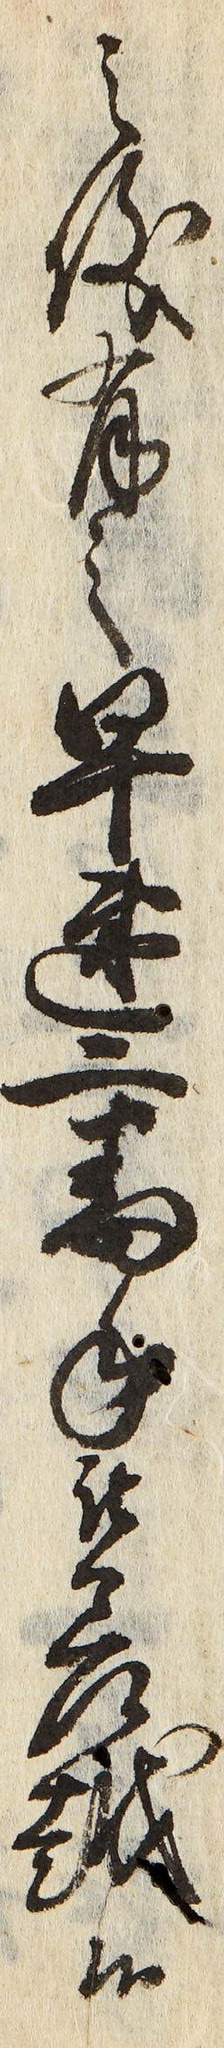之儀有之早速二番手被差越候
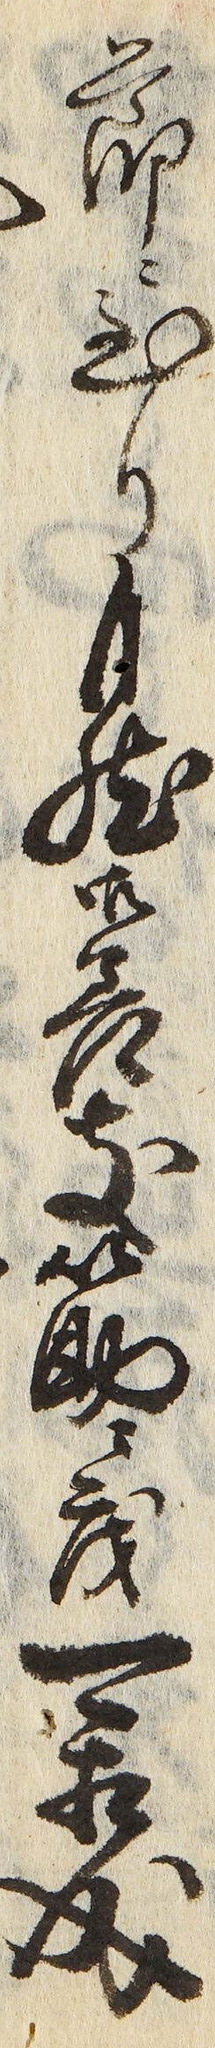節ニ至り自然御差支筋ニも可相成
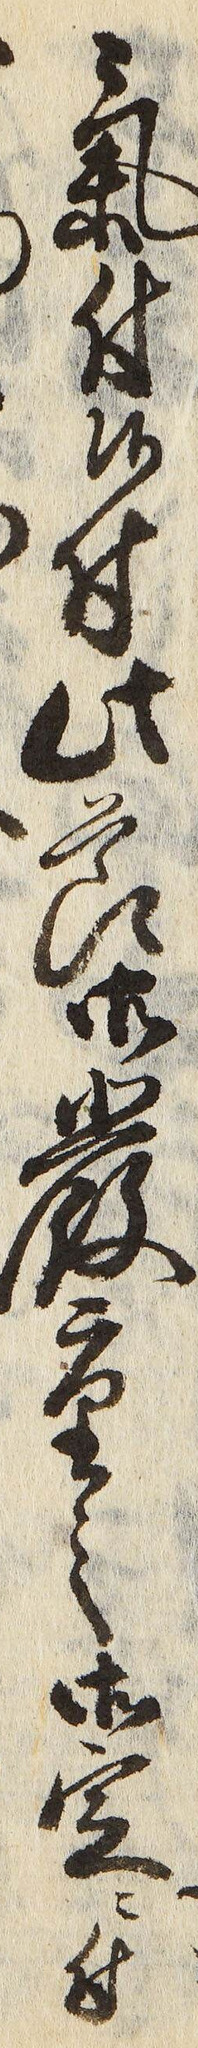気付候付此節御厳重之御定ニ付
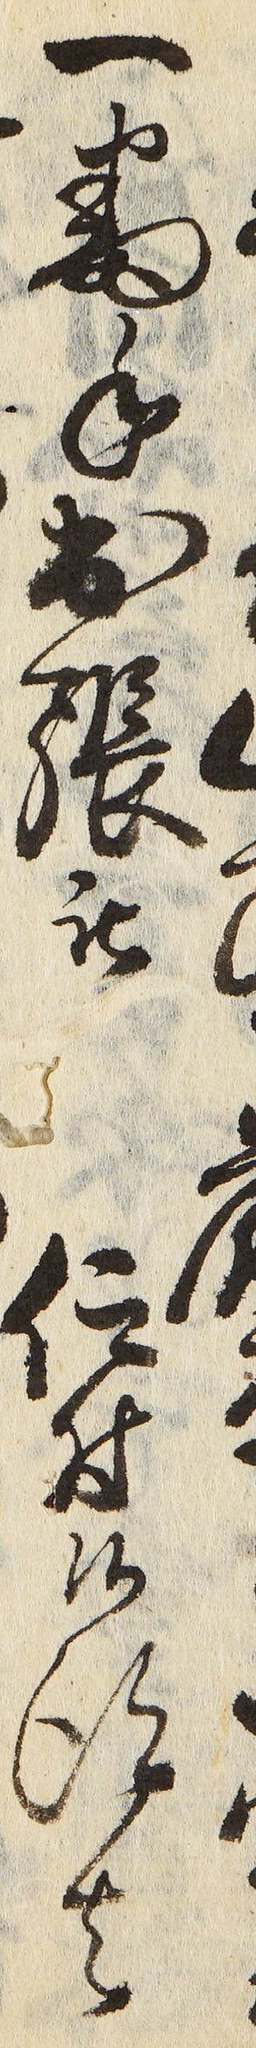一番手出張被仰付候得者
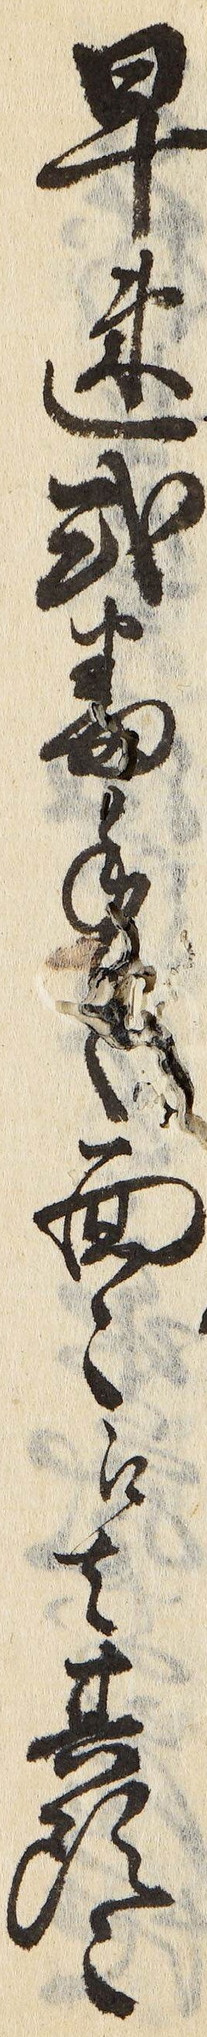早速弐番手之面々江者其頭々
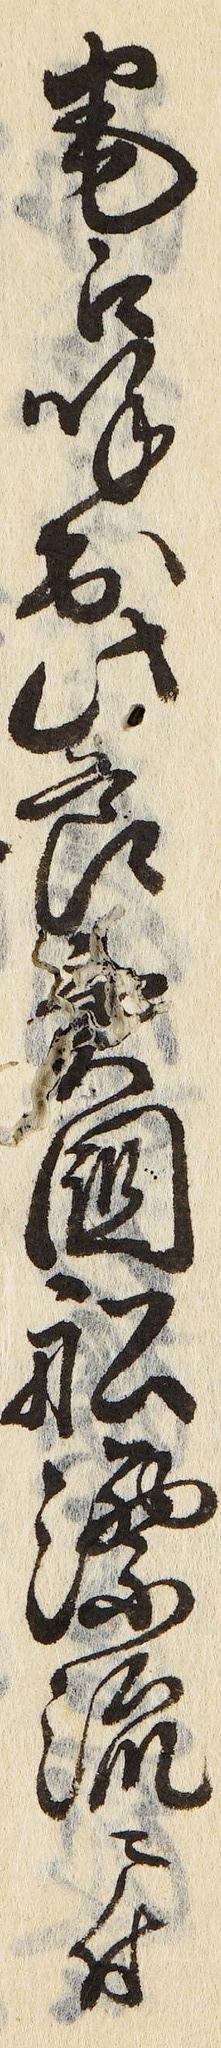宅江呼出此節異国船漂流ニ付
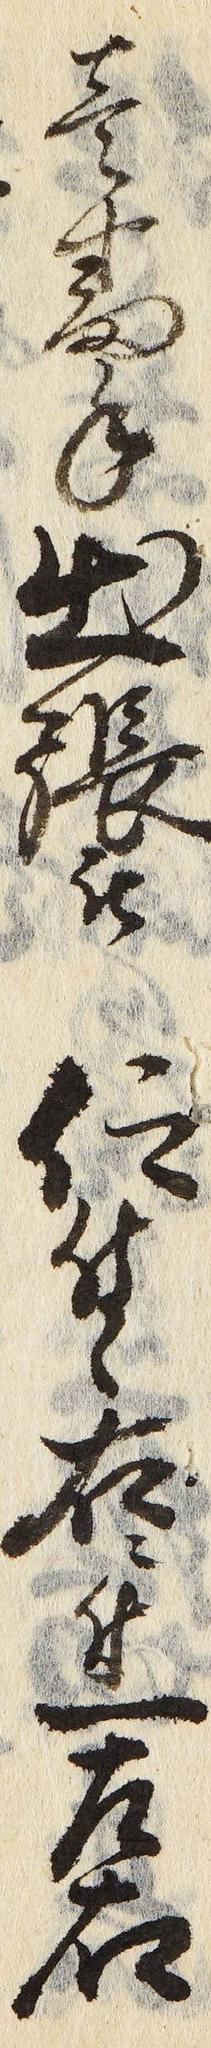壱番手出張被仰付候右ニ付一左右
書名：御領海江異国船漂流有之節御手当之次第大組頭心得之廉々書集記
